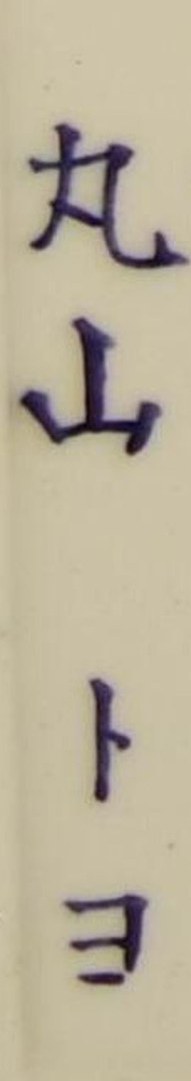丸山トヨ

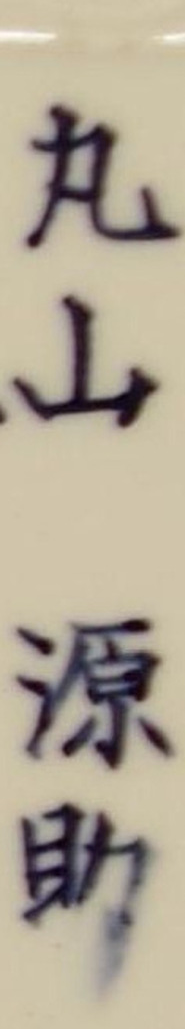丸山源助
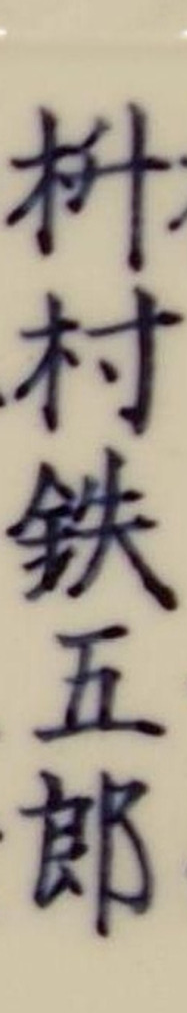枡村鉄五郎
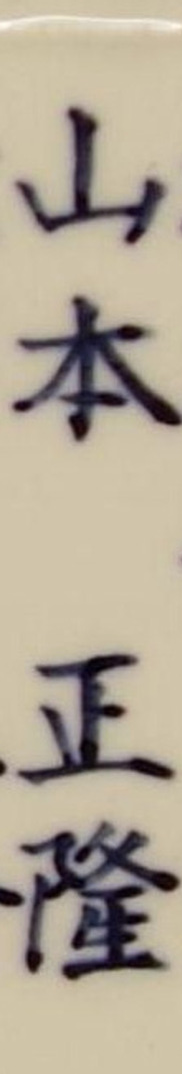山本正隆
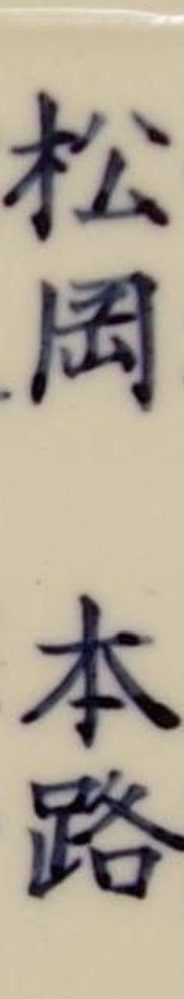松岡本路
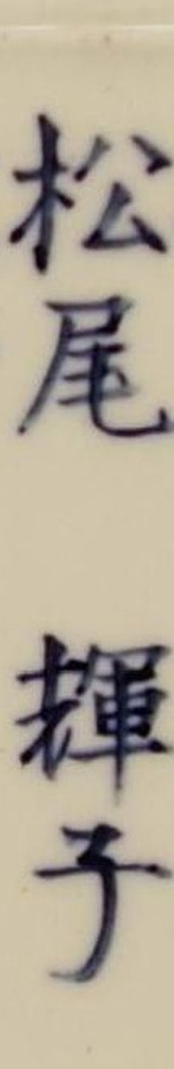松尾輝子
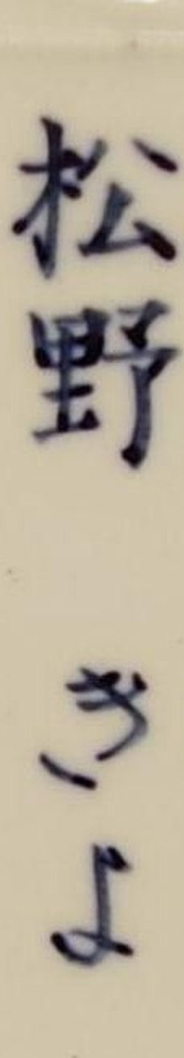松野きよ
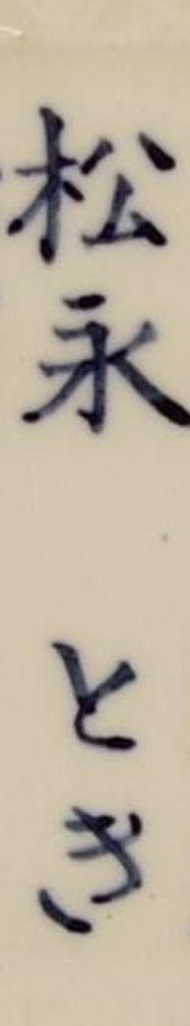松永とき
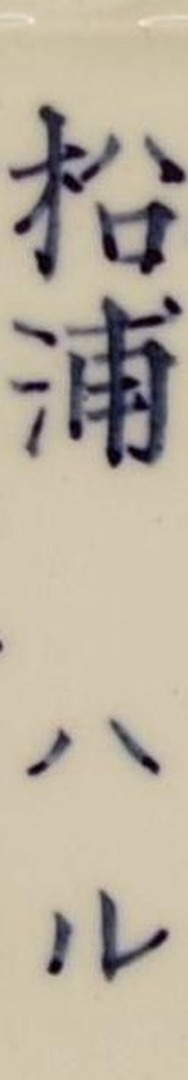松浦ハル
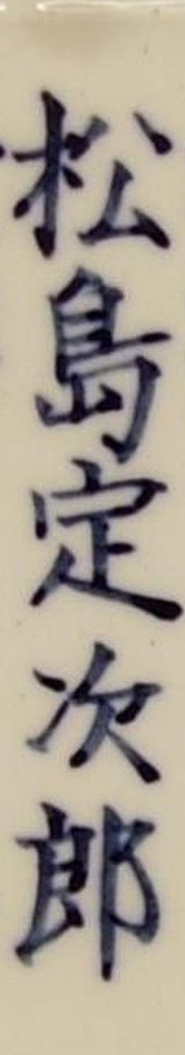松島定次郎
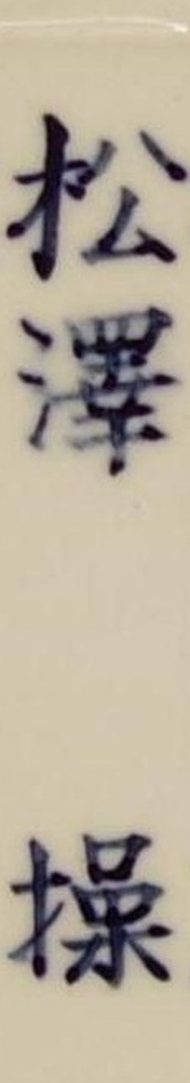松澤操
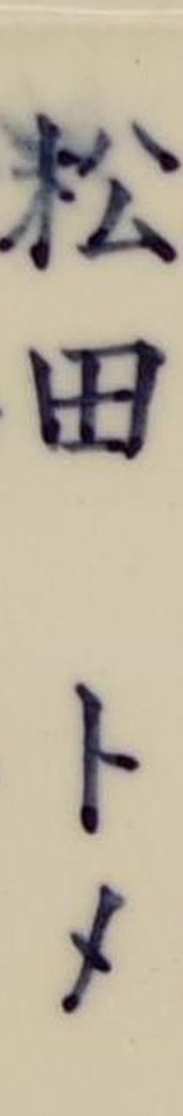松田トメ
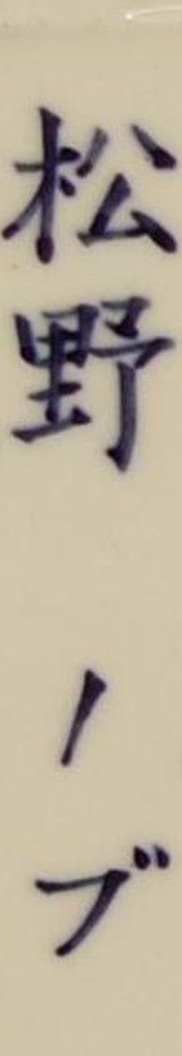松野ノブ
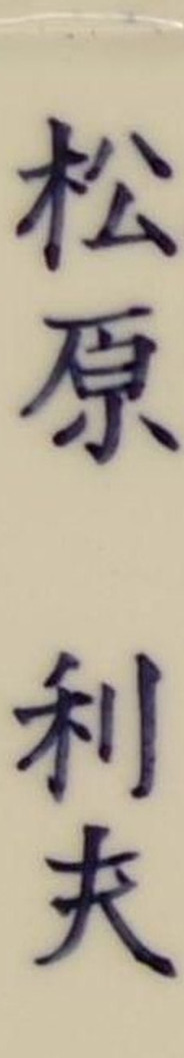松原利夫

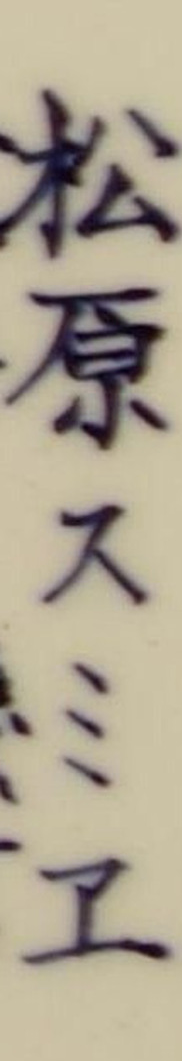松原スミエ
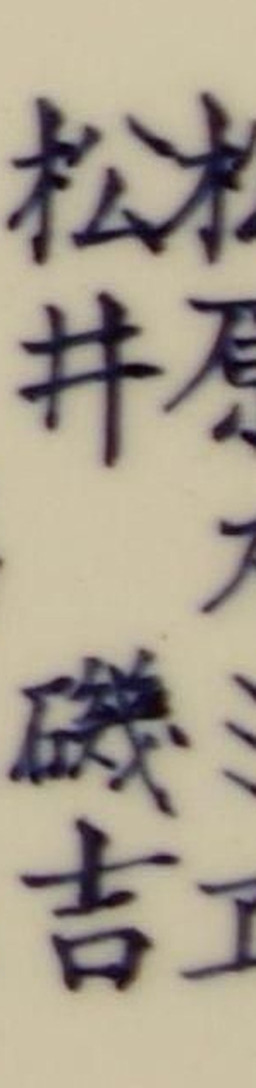松井磯吉
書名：E~L
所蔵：高野山金剛峯寺
